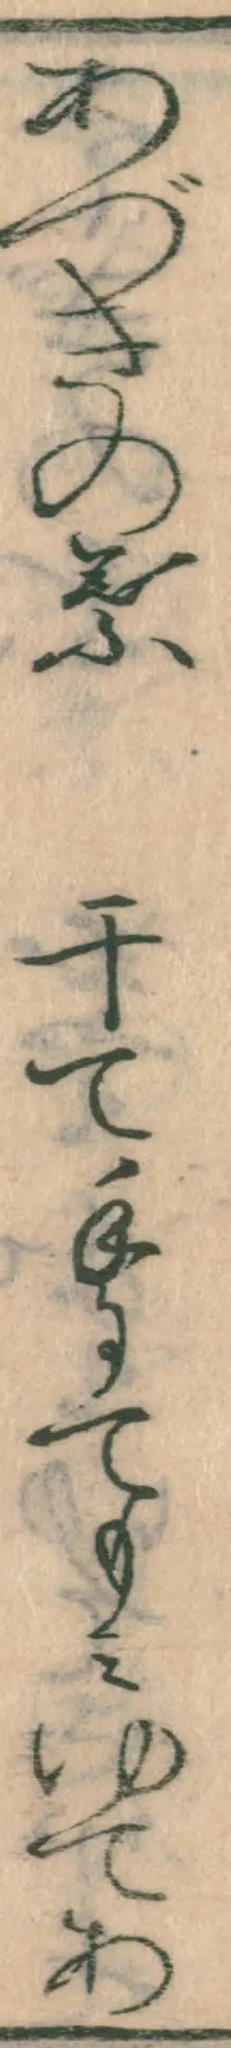あづきの葉干て手にてもみゆてあ
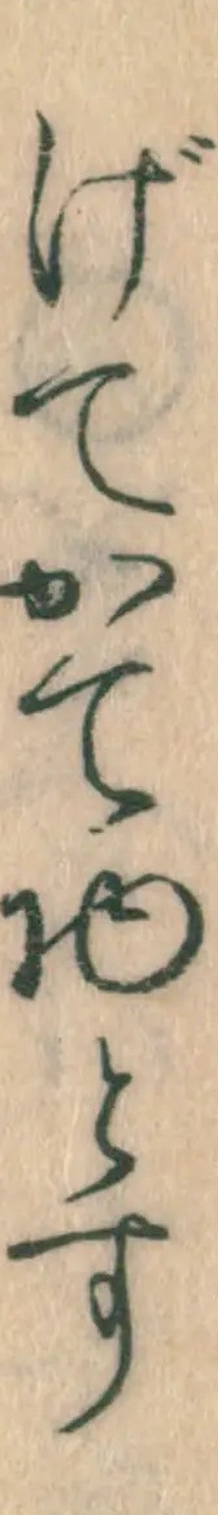げてかて物とす
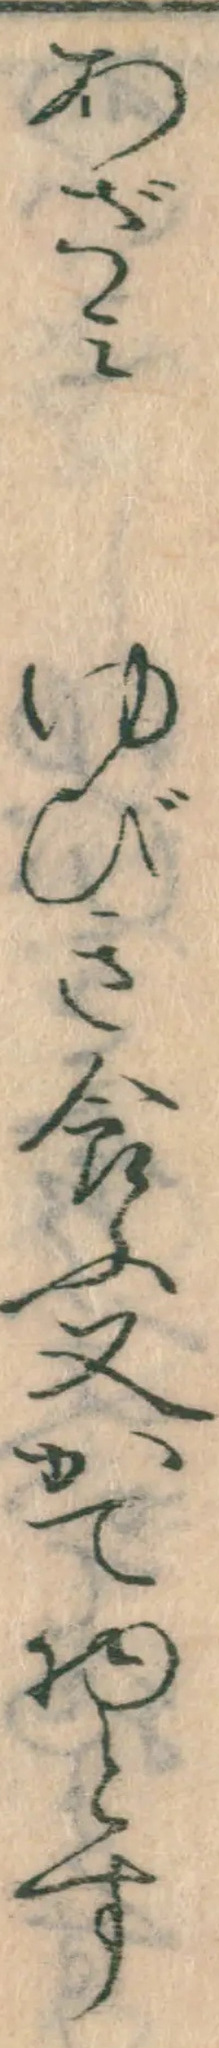あざみゆびき食ふ又かて物とす
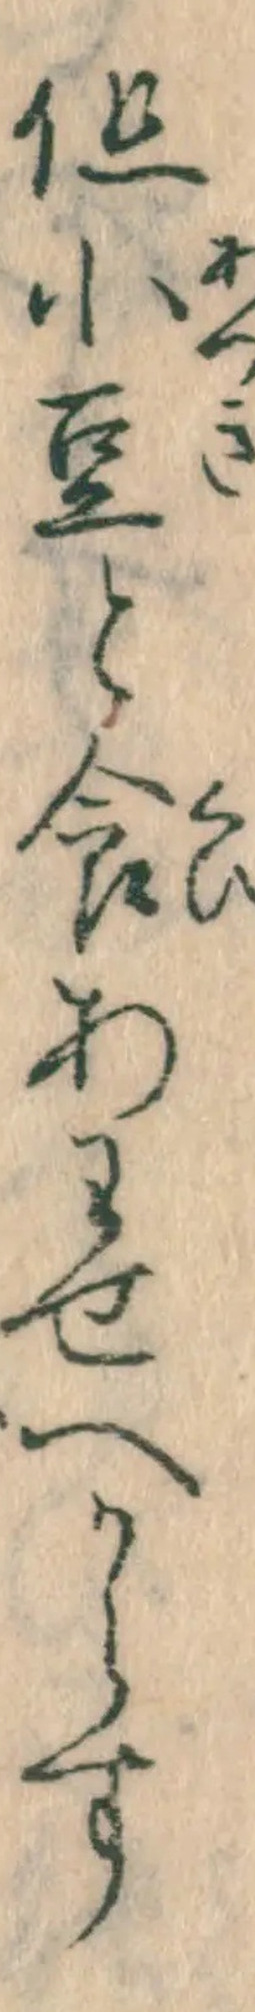但小豆と食あわせへからす
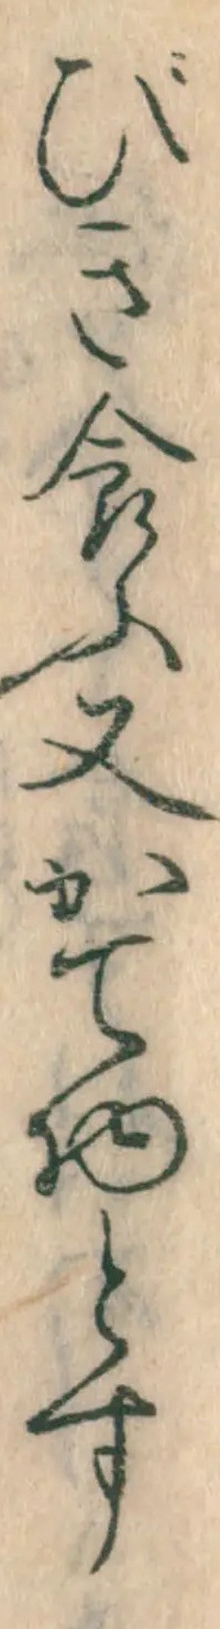びき食ふ又かて物とす

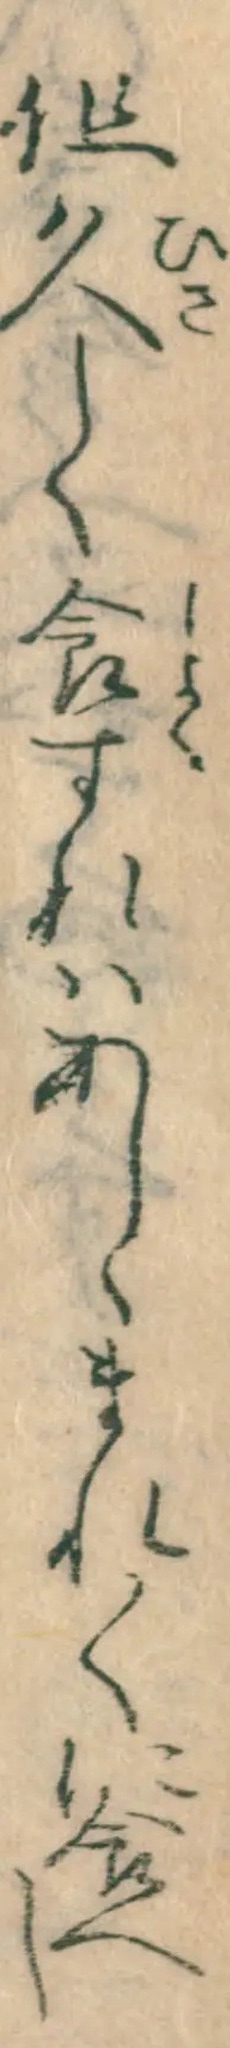但久しく食すれはあしくまれ〳〵に食へし
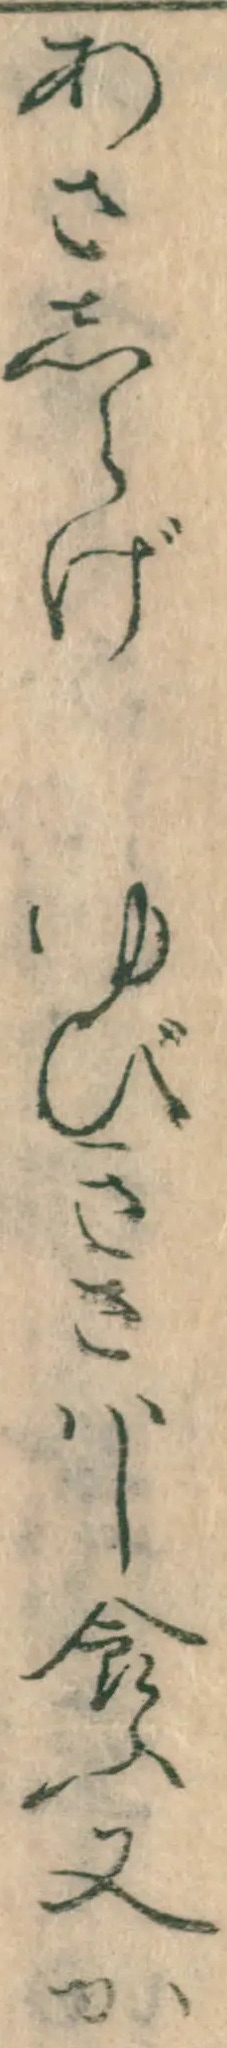あさしらげゆびきさはし食ふ又か
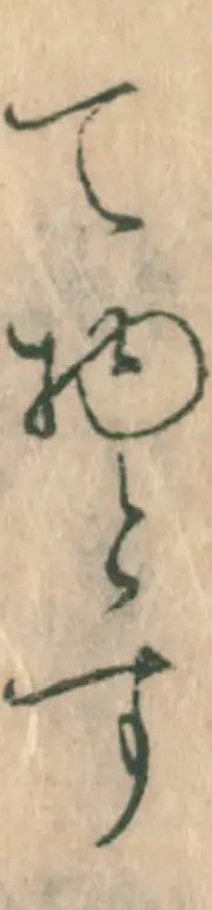て物とす
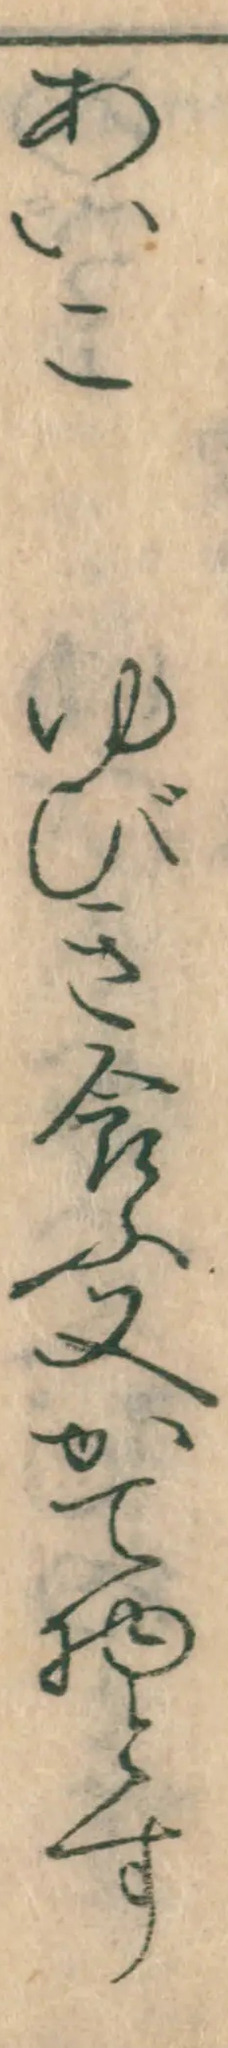あいこゆびき食ふ又かて物とす
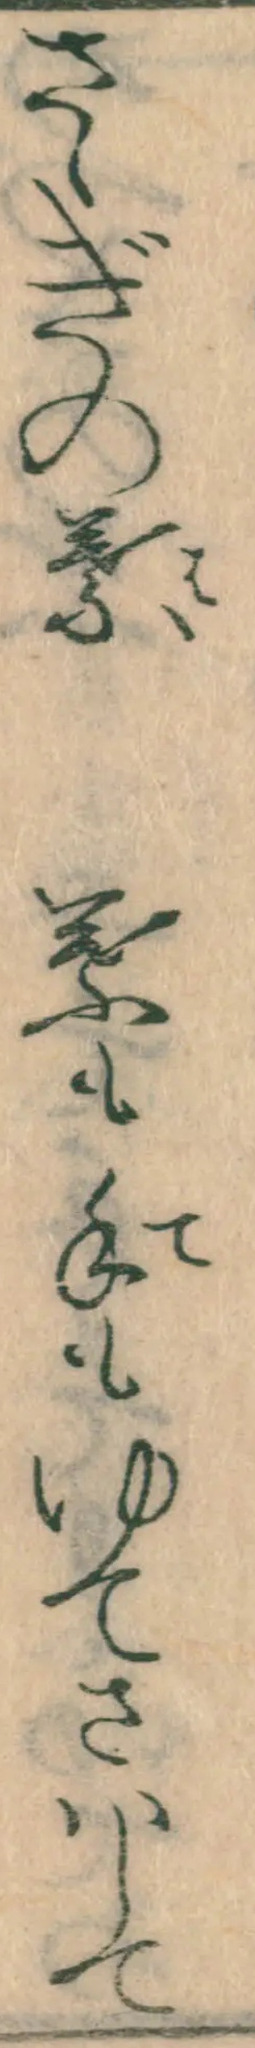さゝぎの葉葉も手もゆてさはして
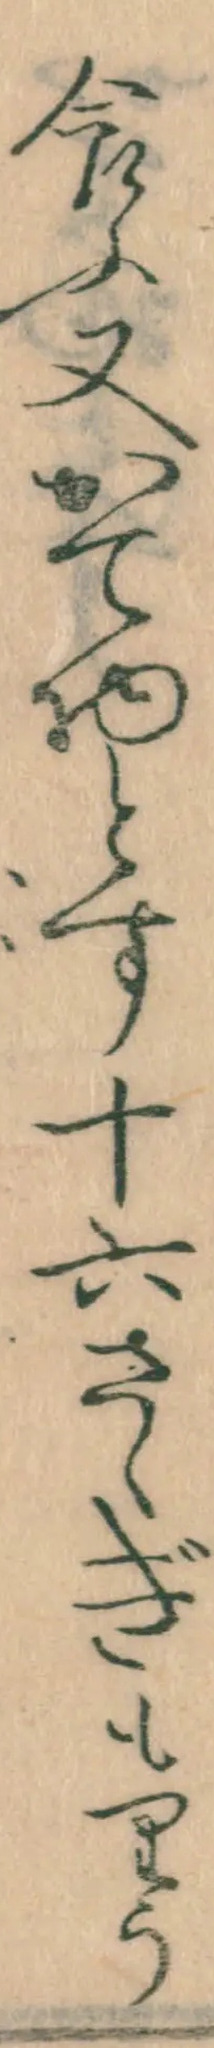食ふ又かて物とす十六さゝぎもりう
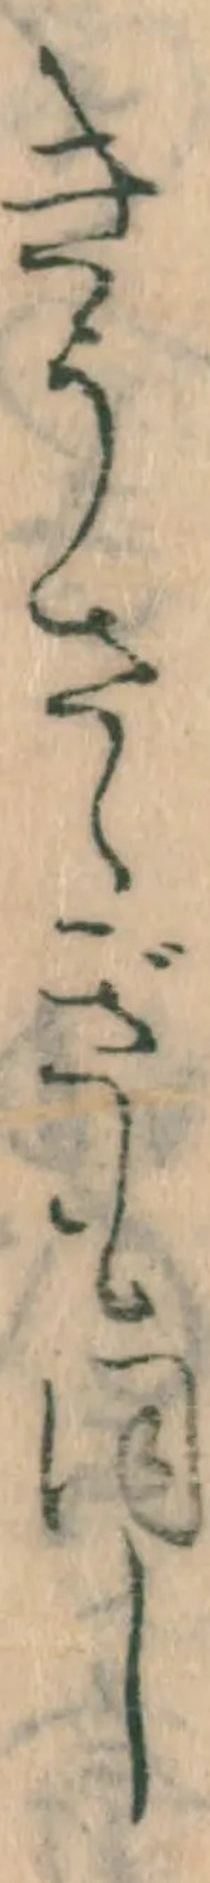きうさゝぎも同し
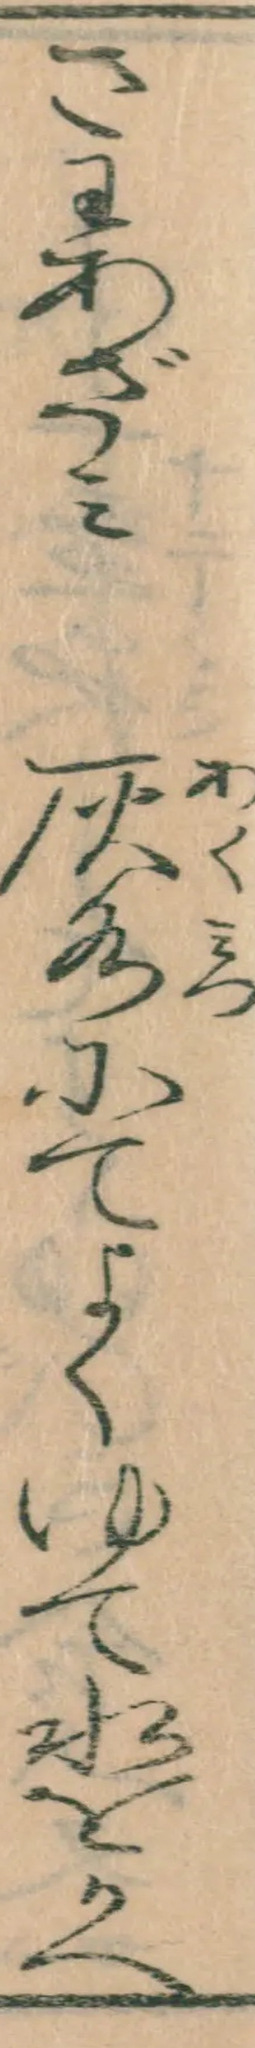さわあざみ灰水にてよくゆて水をかへ
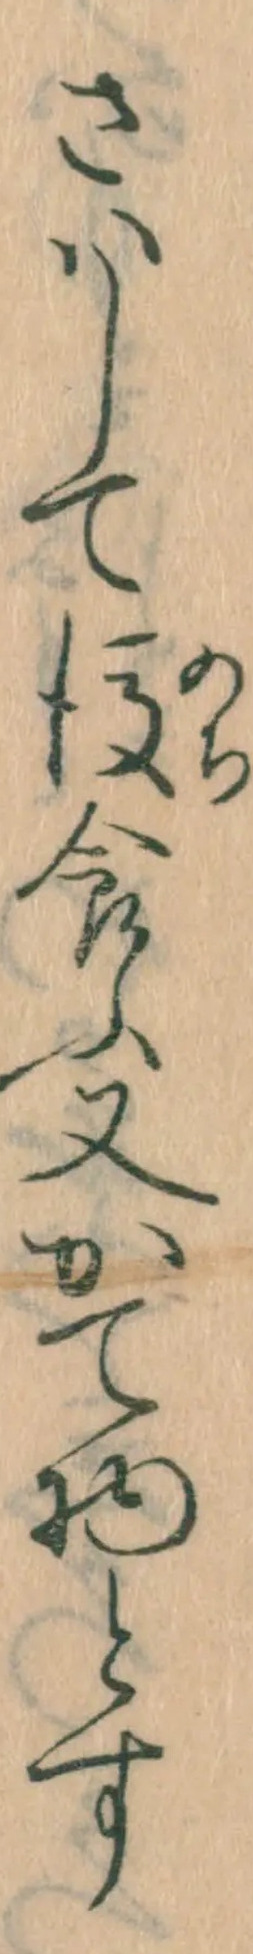さはして後食ふ又かて物とす
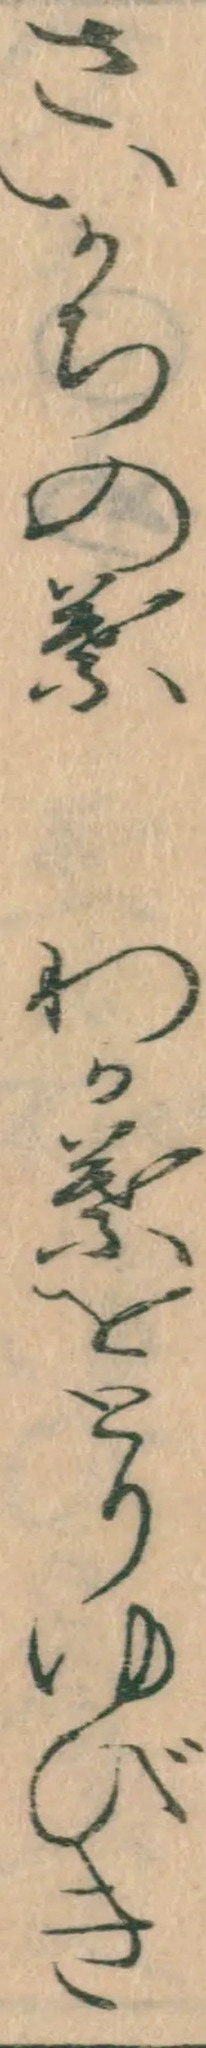さいかちの葉わか葉をとりゆびき
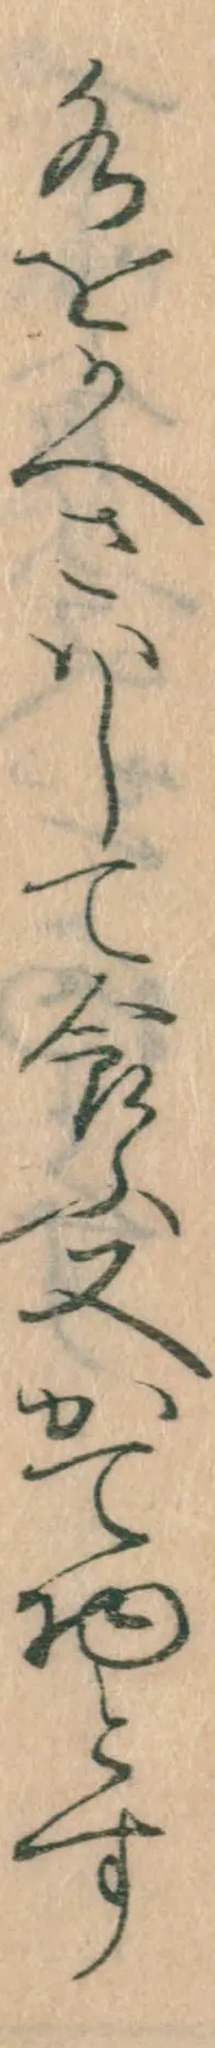水をかへさはして食ふ又かて物とす
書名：かてもの
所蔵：国立国会図書館 National Diet Library, JAPAN
